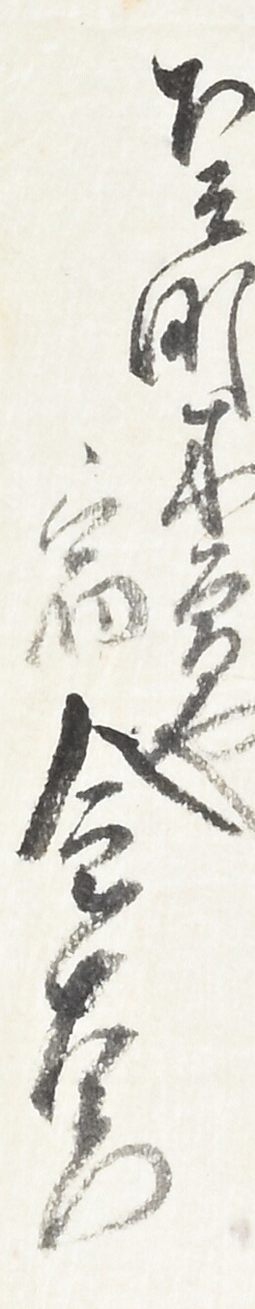宿金右衛門
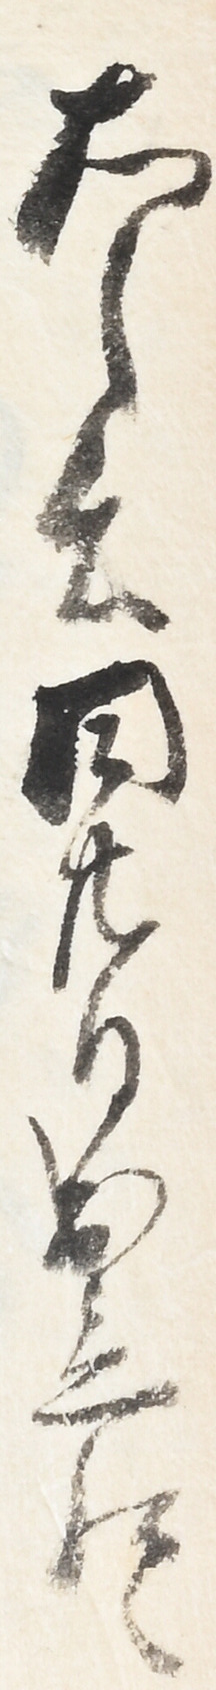右之者同廿四日出立仕候

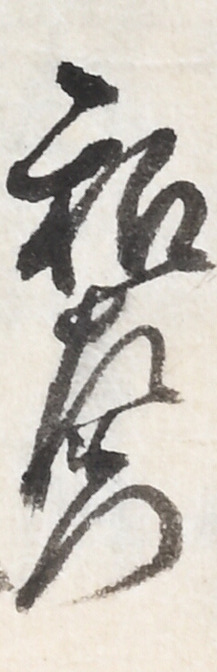忠左衛門
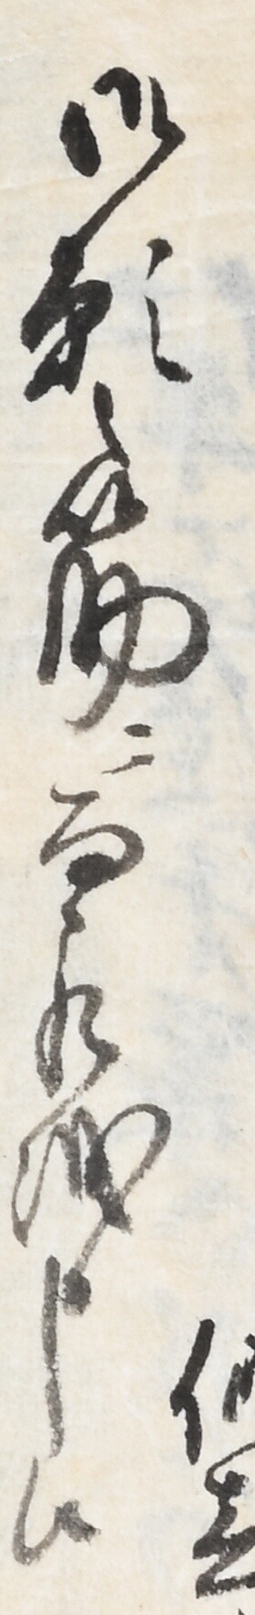呉服商売ニ而罷越申候
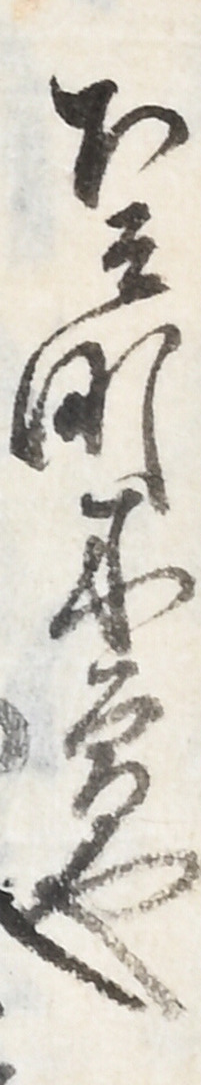下モ町木曽屋
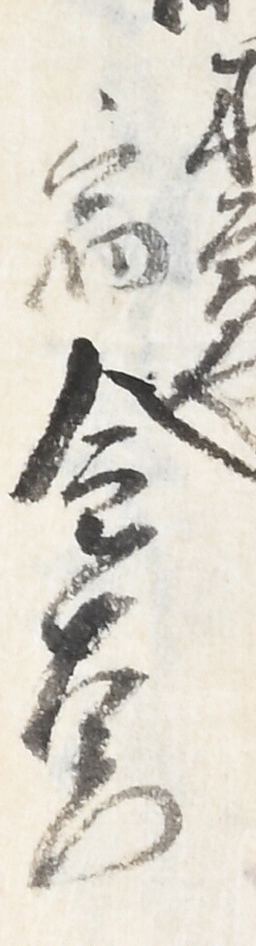宿金右衛門
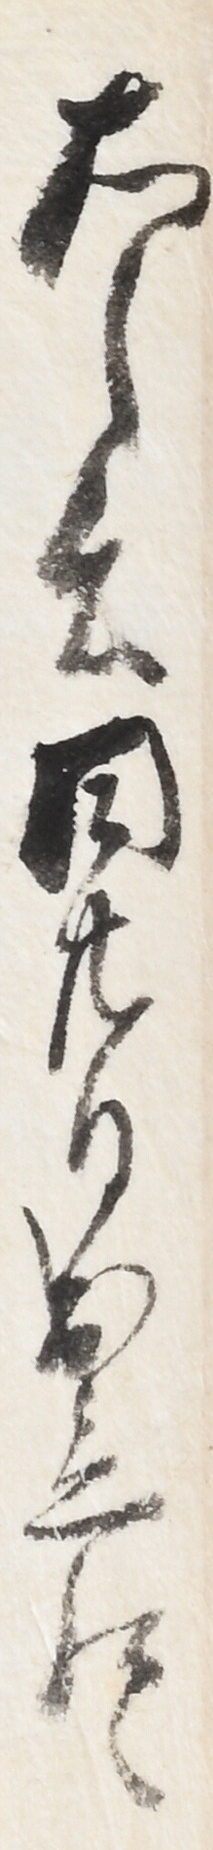右之者同廿日出立仕候
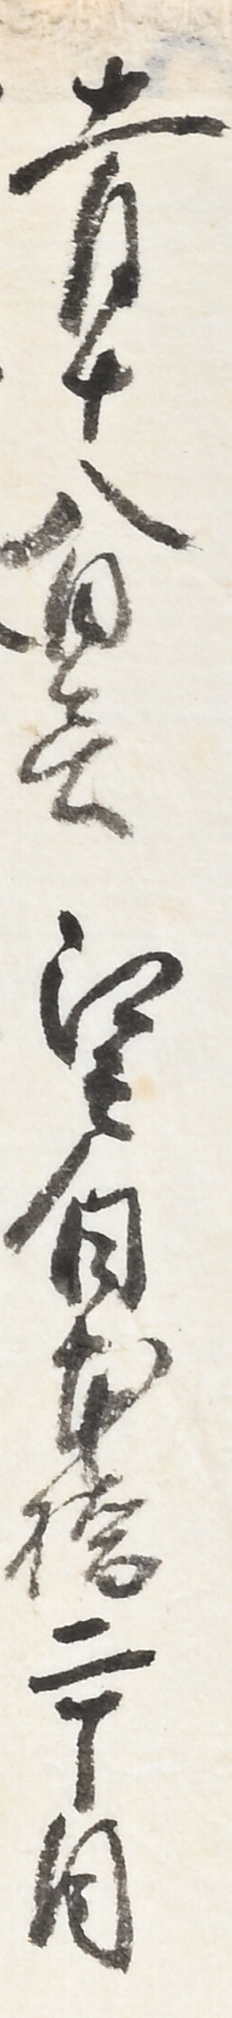十一月十八日着江戸日本橋二丁目
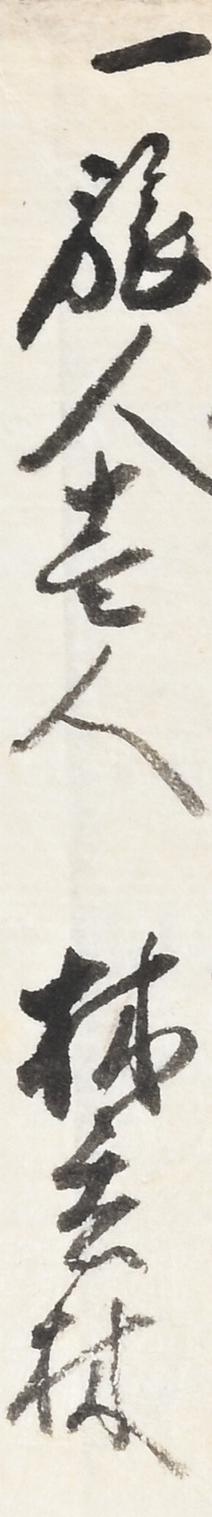一旅人壱人林玄林
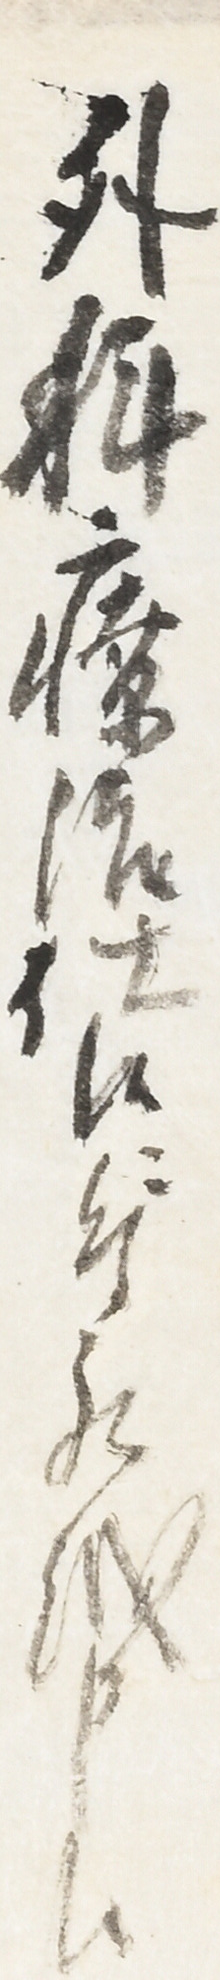外科療治仕候ニ付罷越申候
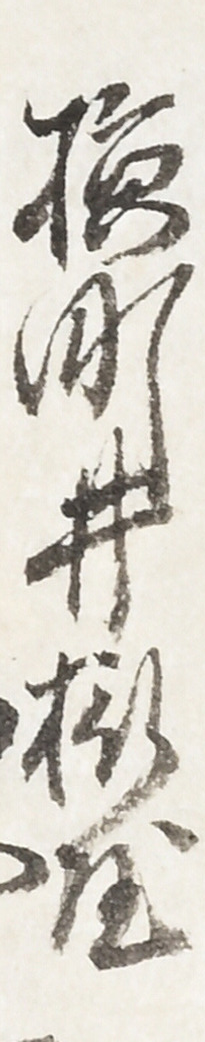横町井桁屋
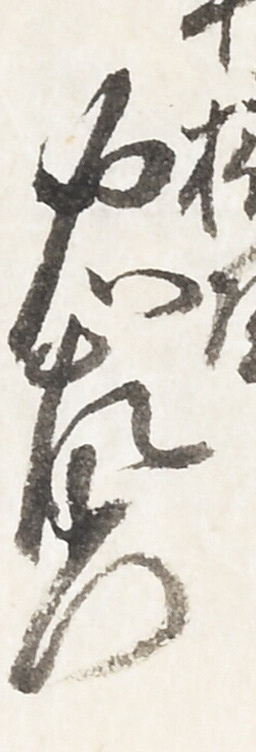忠左衛門
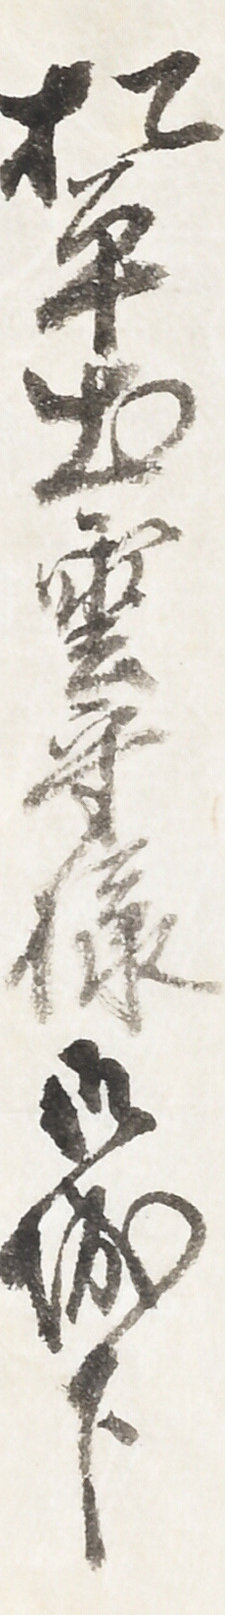松平出雲守様御城下
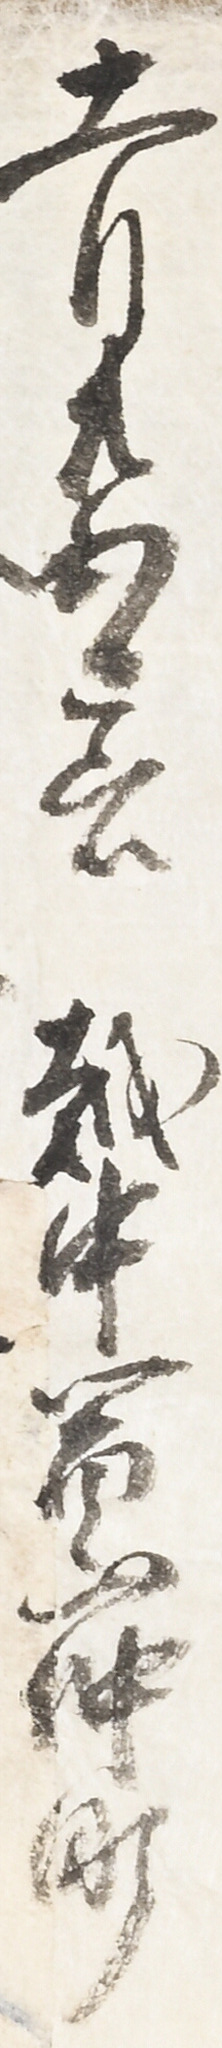十一月廿五日着越中冨山仲町
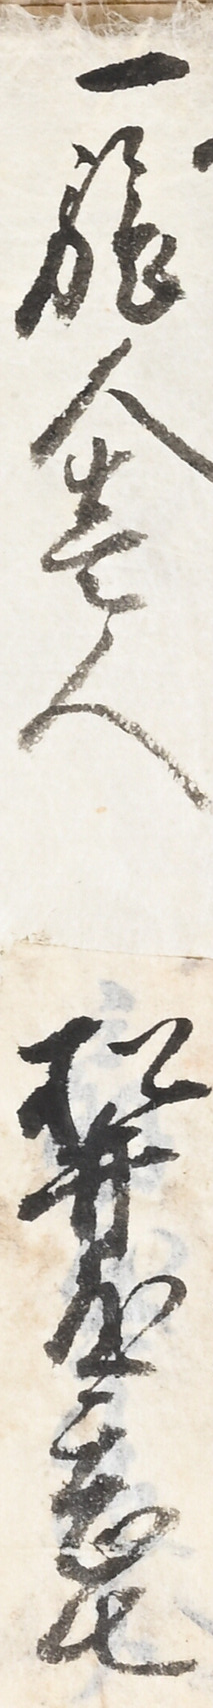一旅人壱人松井屋甚七
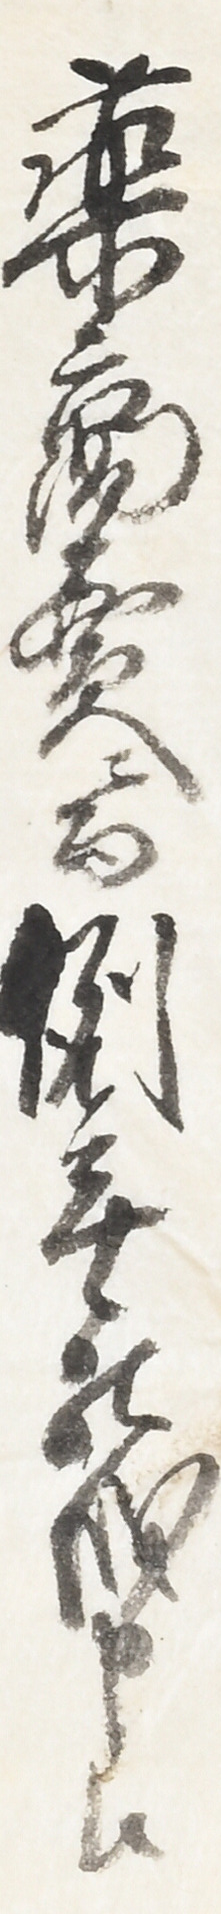薬商売ニ而例年罷越申候
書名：旅人泊控帳
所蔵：伊那市立高遠町図書館・合同会社AMANE
